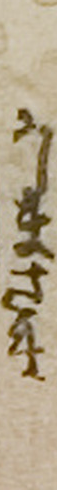かしまさま
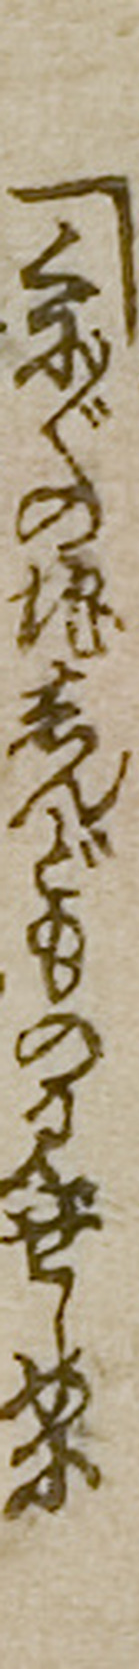「くに〴〵の地しんどもの見せしめに
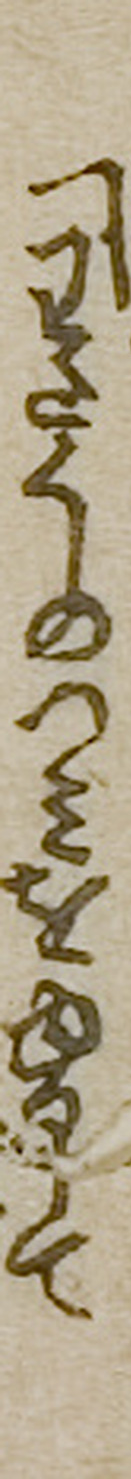「わたくしのつみをゆるして
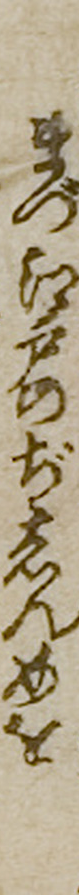まづ江戸のぢしんめを
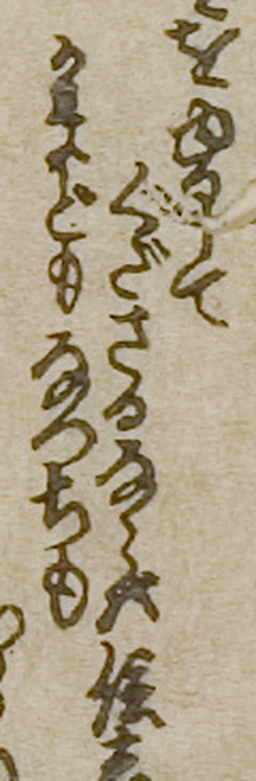くださるならば
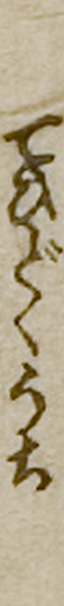てひどくうち
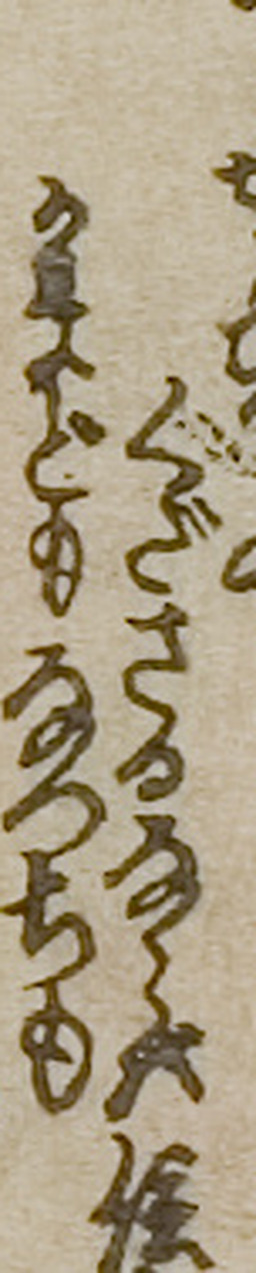かまどもなつちも
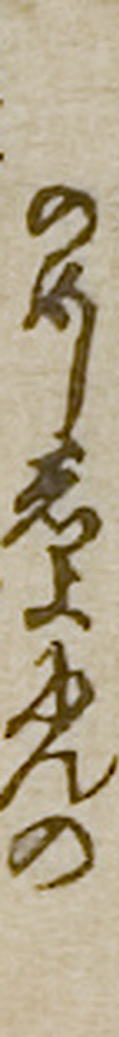のめししよにんの
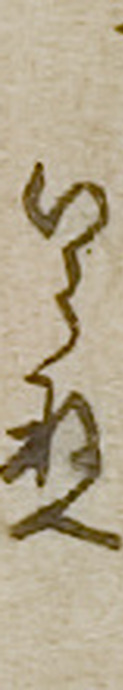いらねへ
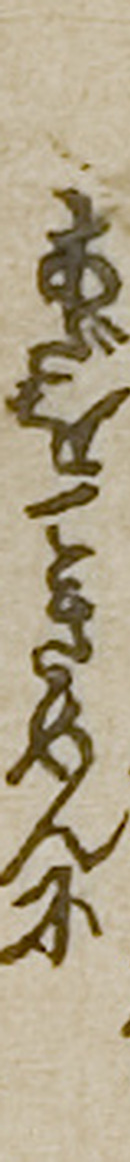あだをてきめんに
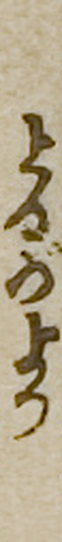とるがよか
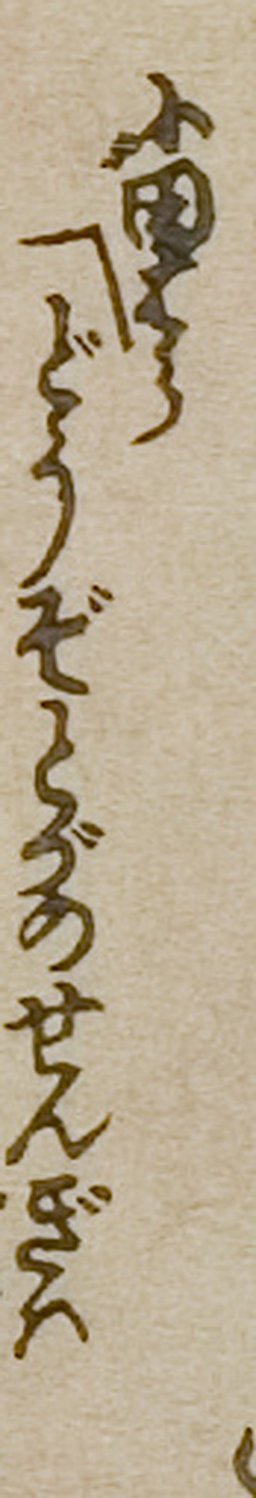「どうぞとがのせんぎは
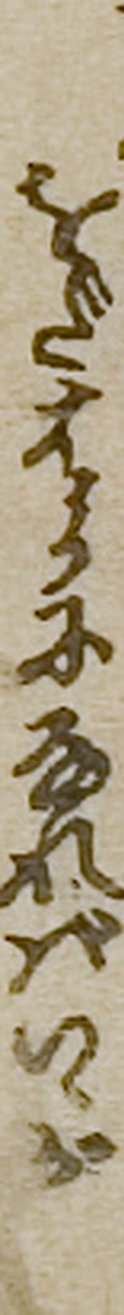をだはらになればいゝが
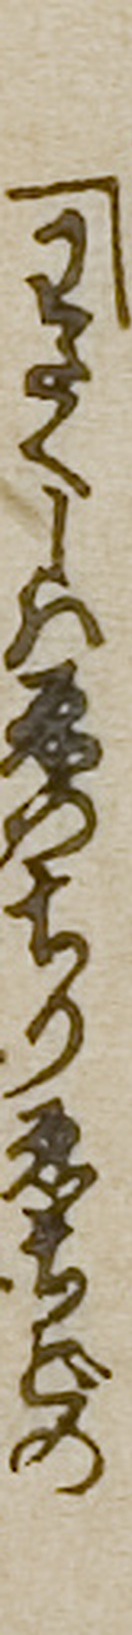「わたくしはゑつちうゑちごの
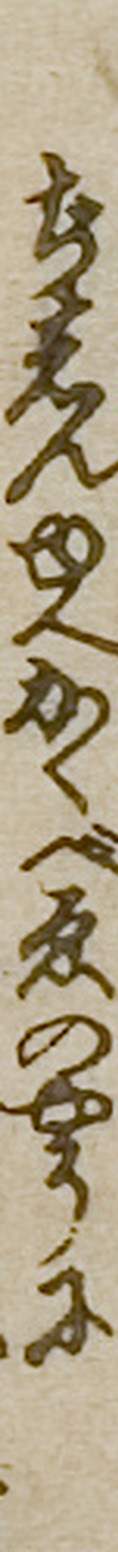ぢしんゆへかくべゑのやうに
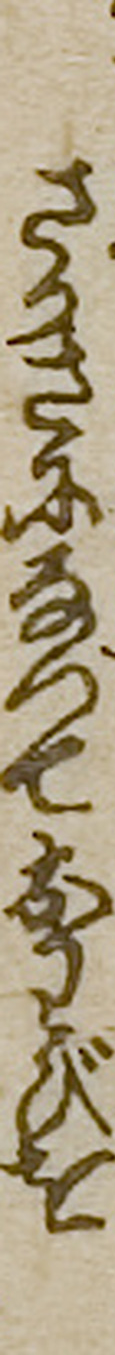さかさになつておわびを
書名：[地震鯰の取り調べ]
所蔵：東京大学総合図書館 General Library in the University of Tokyo, JAPAN
